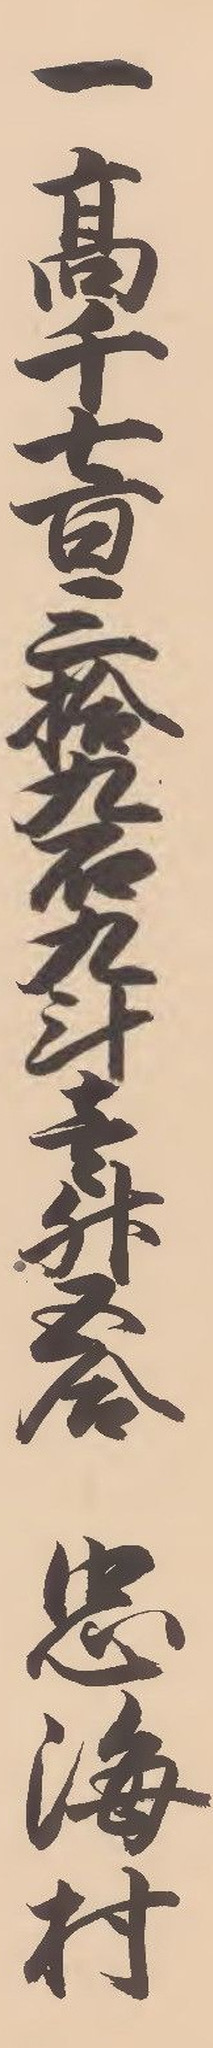一高千七百三拾九石九斗壱升五合忠海村
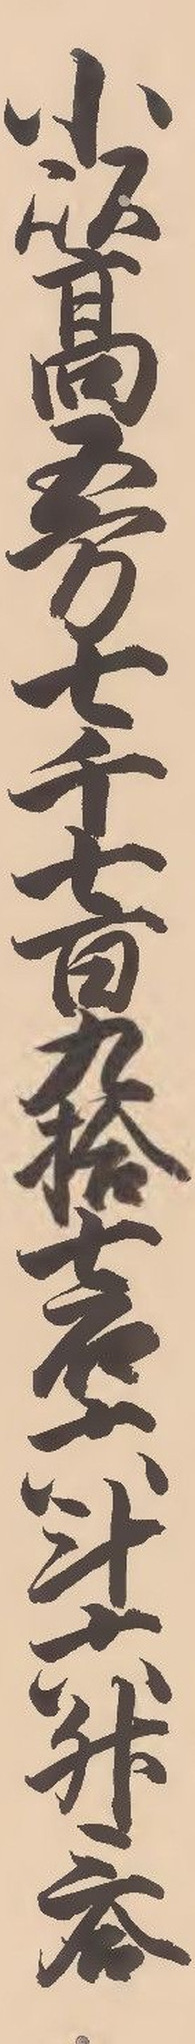小以高五万七千七百九拾七石六斗六升三合
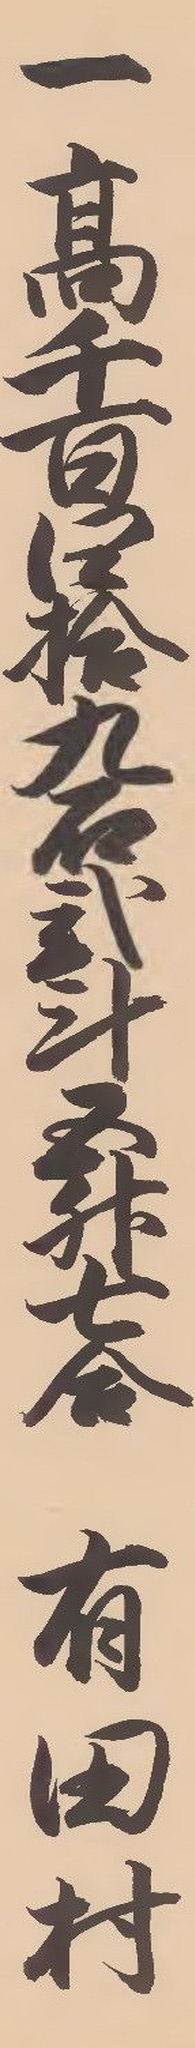一高千百四拾九石弐斗五升七合有田村
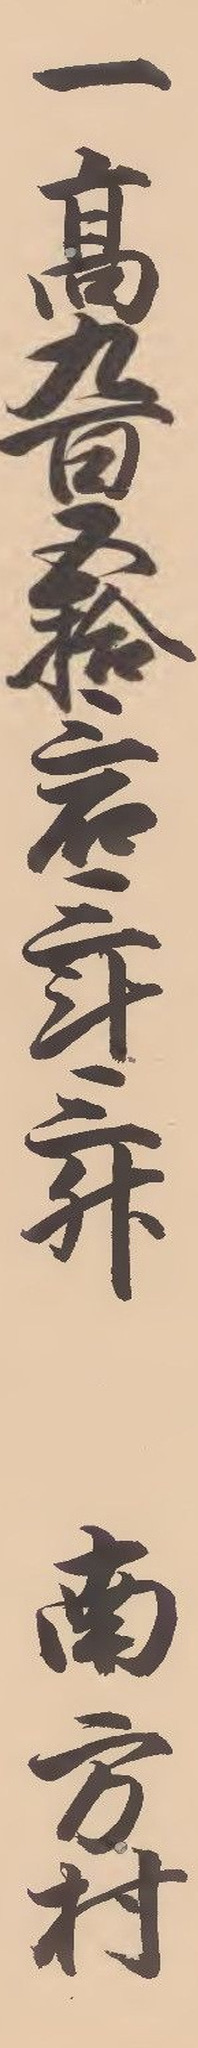一高九百五拾三石三斗三升南方村
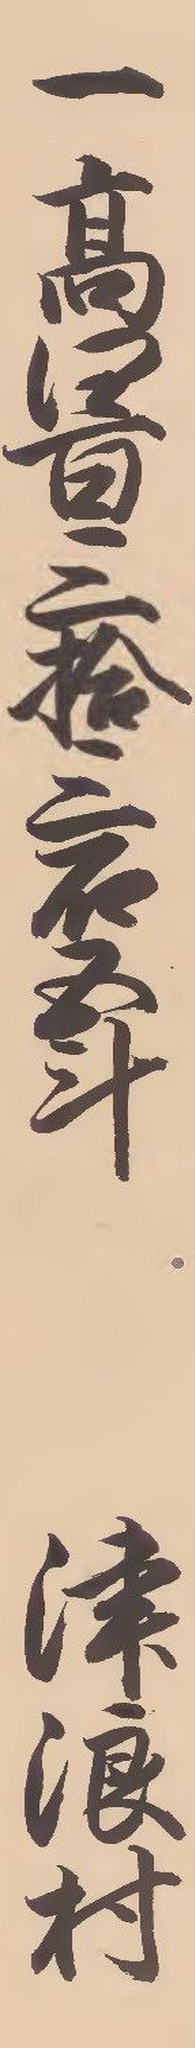一高四百三拾三石五斗津浪村

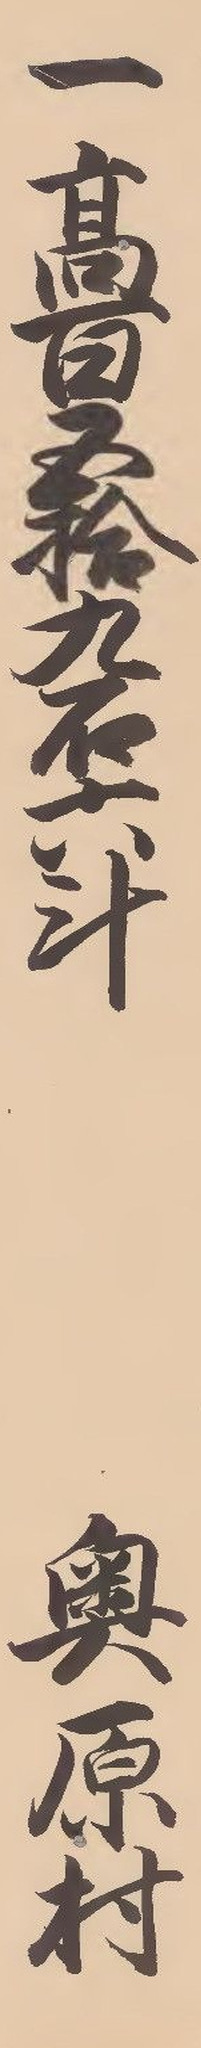一高百五拾九石六斗奥原村
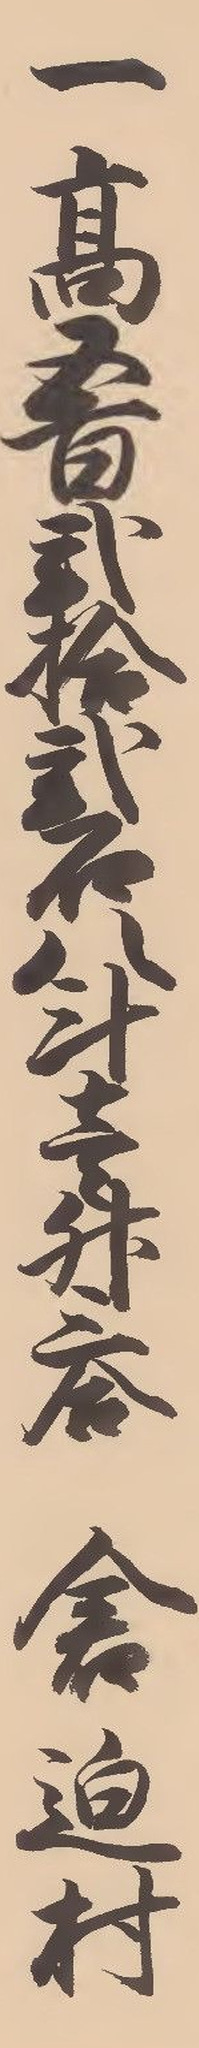一高五百弐拾弐石八斗壱升三合倉迫村
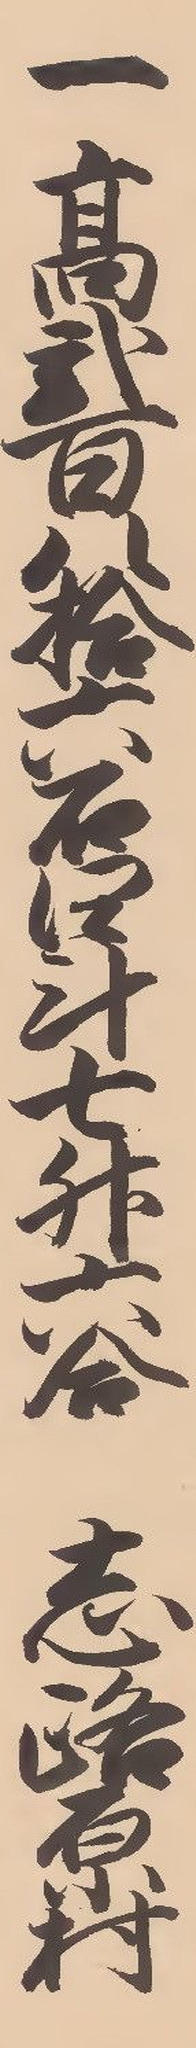一高弐百八拾六石四斗七升六合志路原村
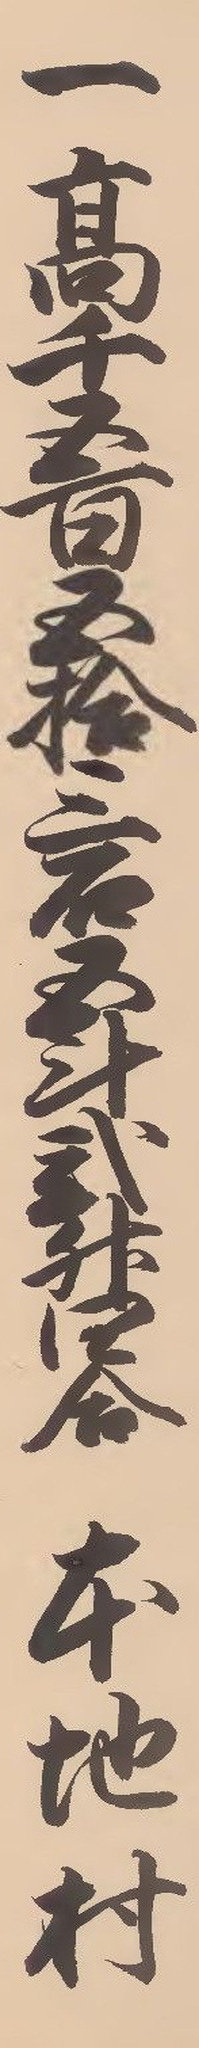一高千五百五拾三石五斗弐升四合本地村
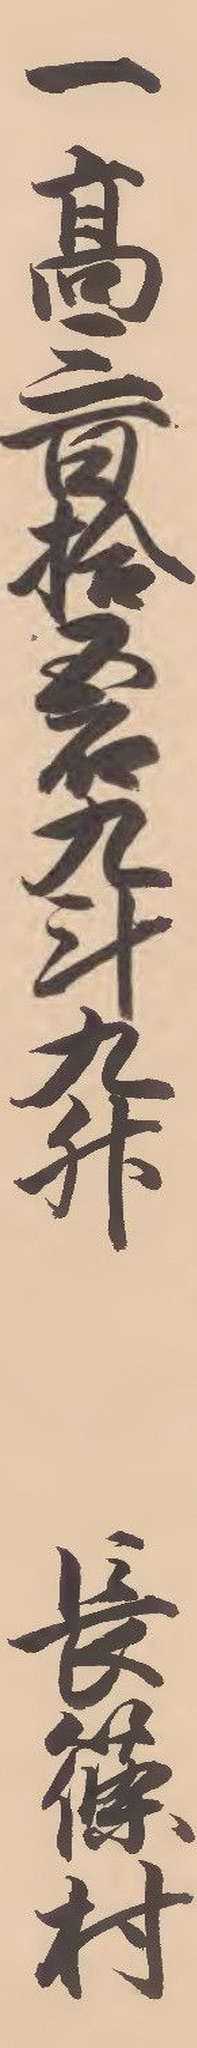一高三百拾五石九斗九升長篠村
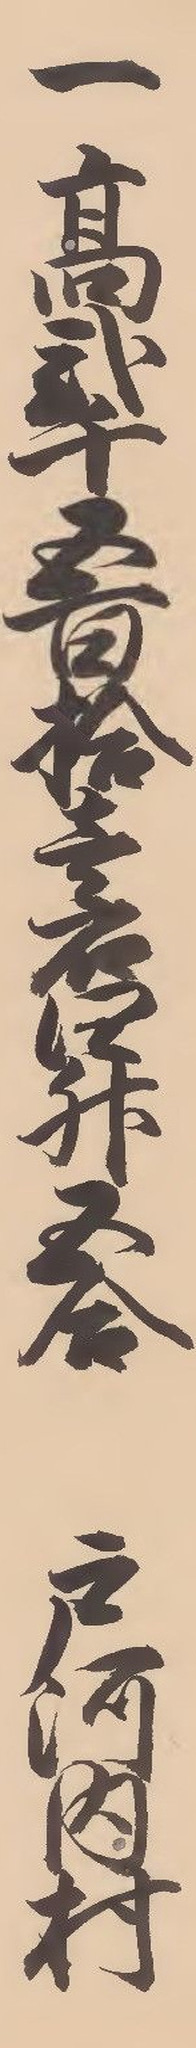一高弐千五百拾壱石四升五合戸河内村
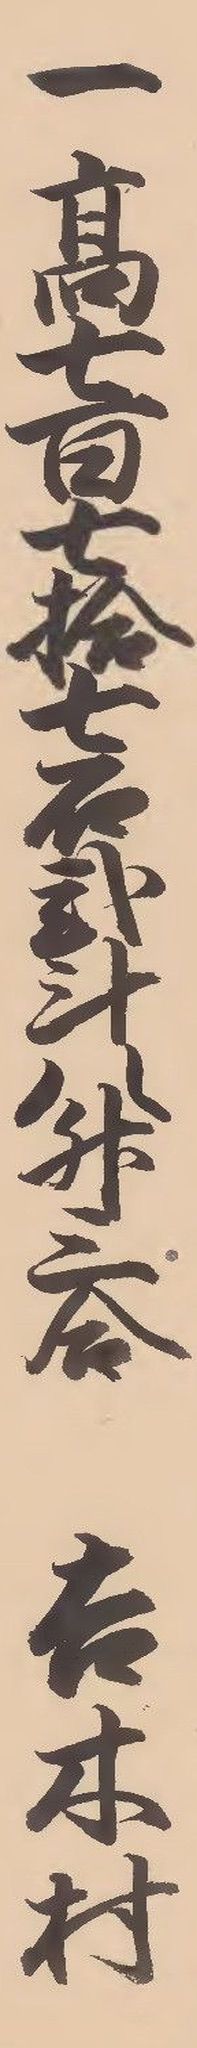一高七百七拾七石弐斗八升三合吉木村

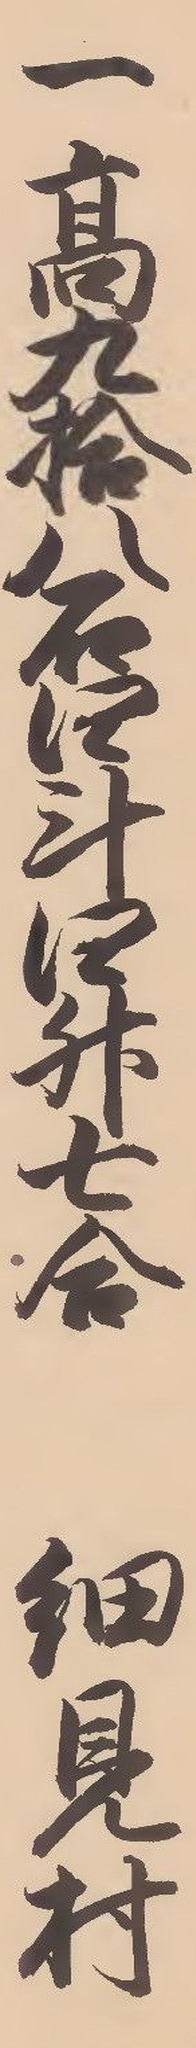一高九拾八石四斗四升七合細見村
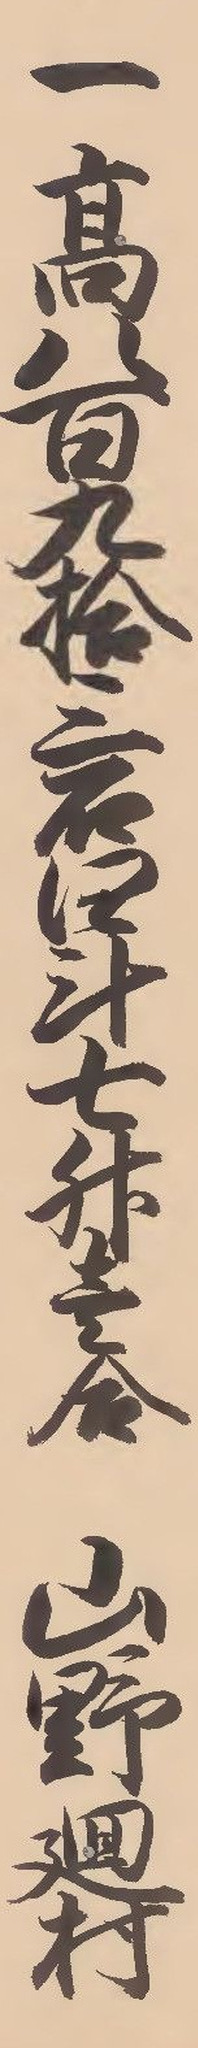一高八百九拾三石四斗七升壱合山野廻村
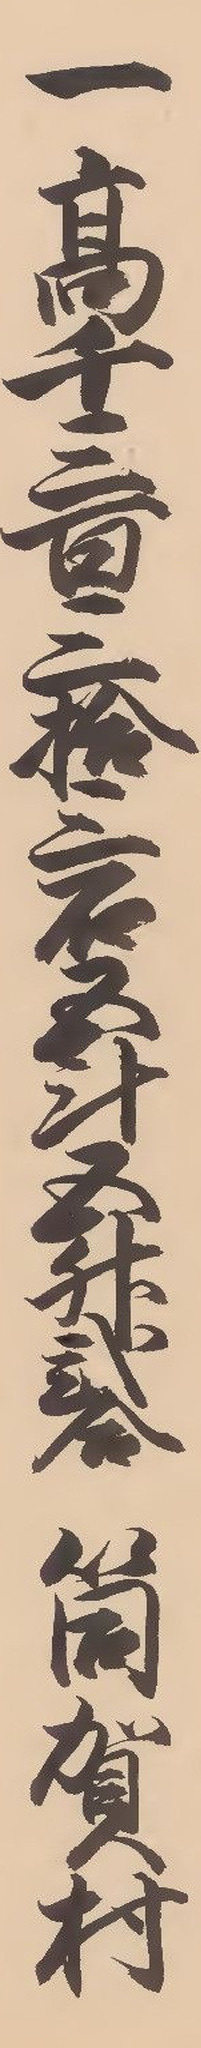一高千三百三拾三石五斗五升弐合筒賀村
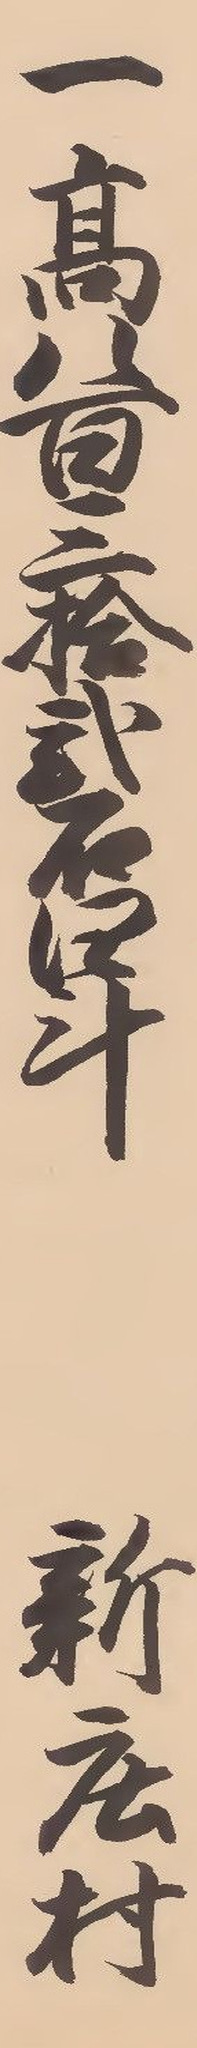一高八百三拾弐石四斗新庄村
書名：安芸国郷帳
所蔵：国立公文書館 National Archives of Japan
